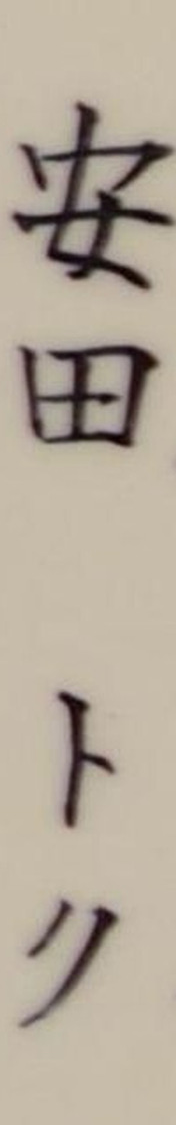安田トク
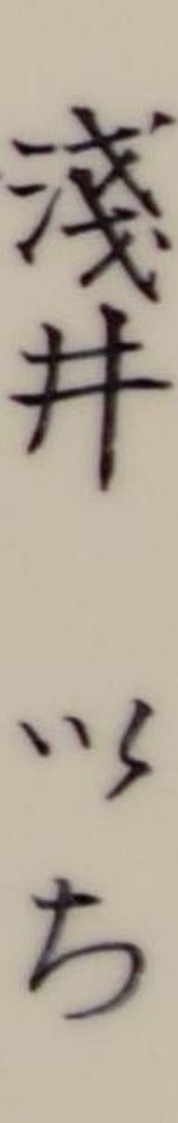浅井いち
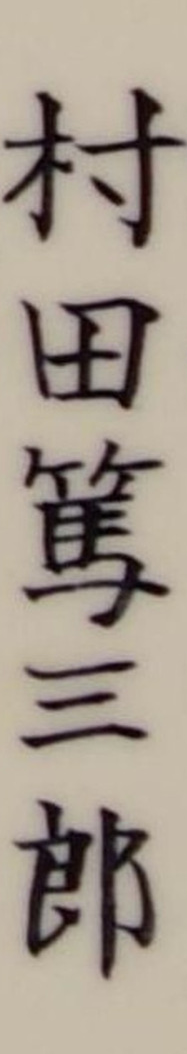村田篤三郎
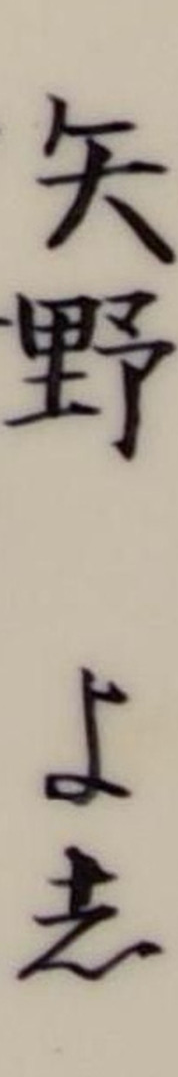矢野よし
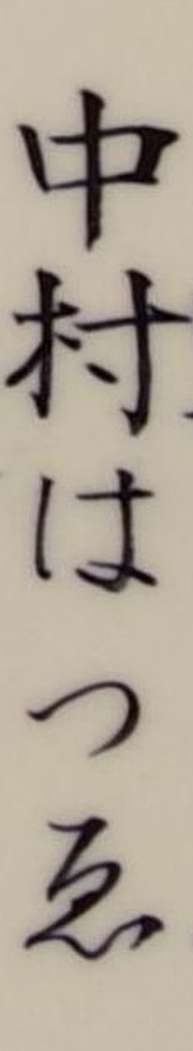中村はつゑ
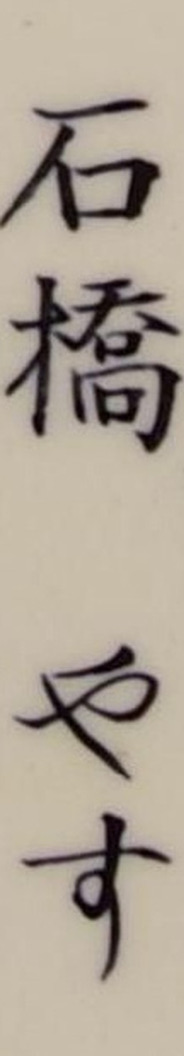石橋やす
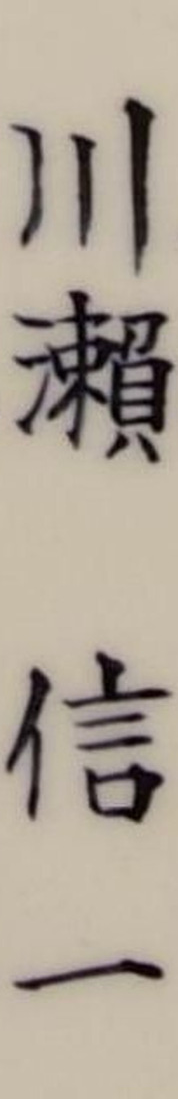川瀬信一
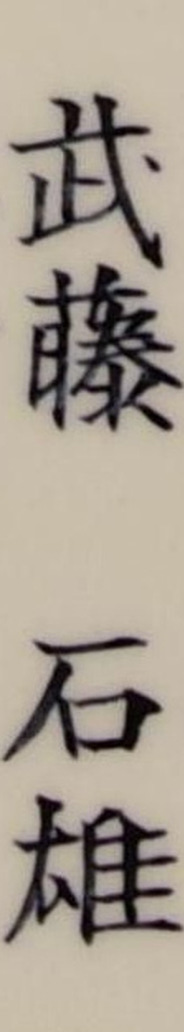武藤石雄
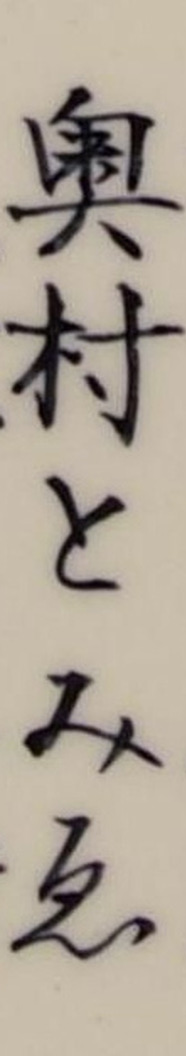奥村とみゑ
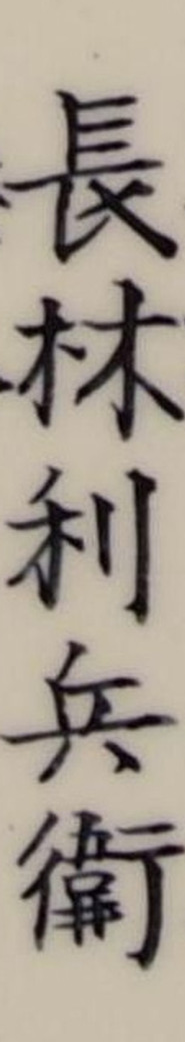長林利兵衛
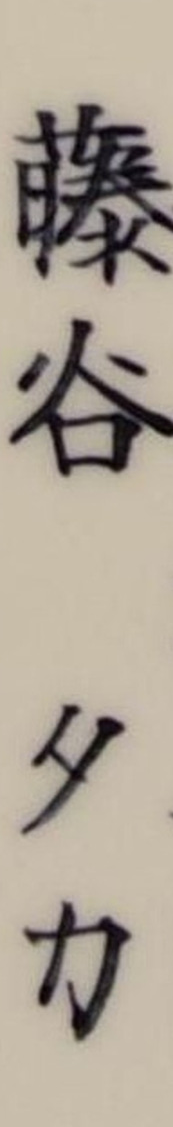藤谷夕カ
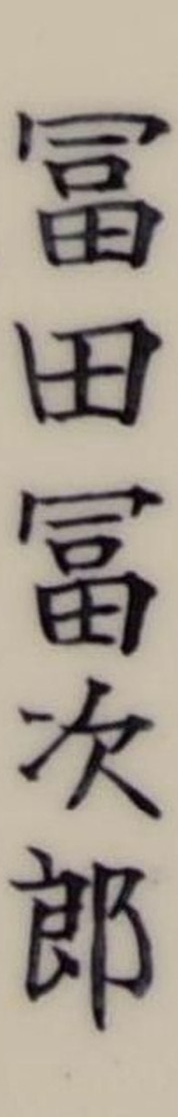冨田冨次郎
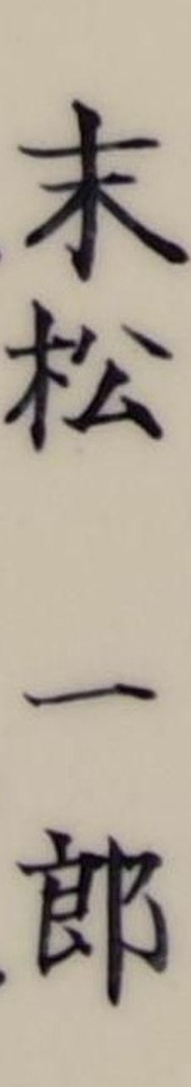末松一郎
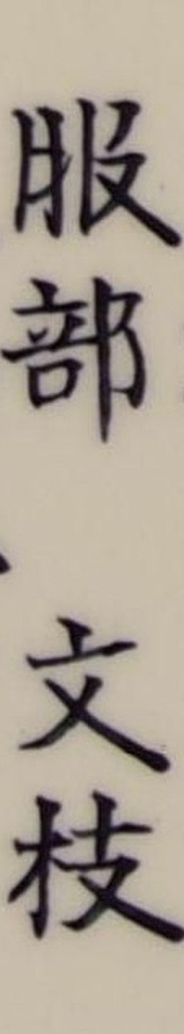服部文枝
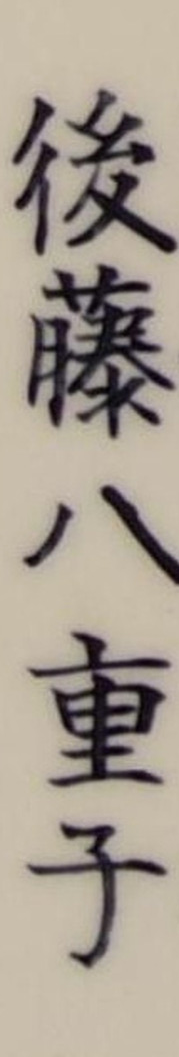後藤八重子
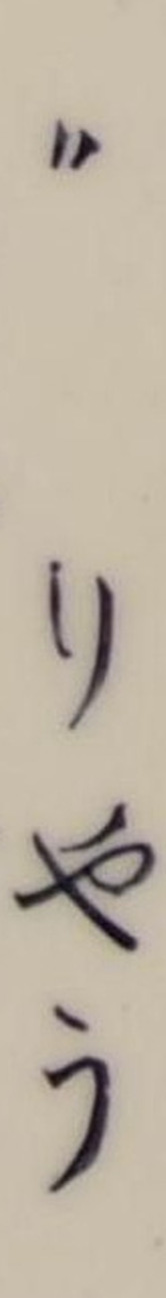りやう
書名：M~S
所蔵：高野山金剛峯寺
